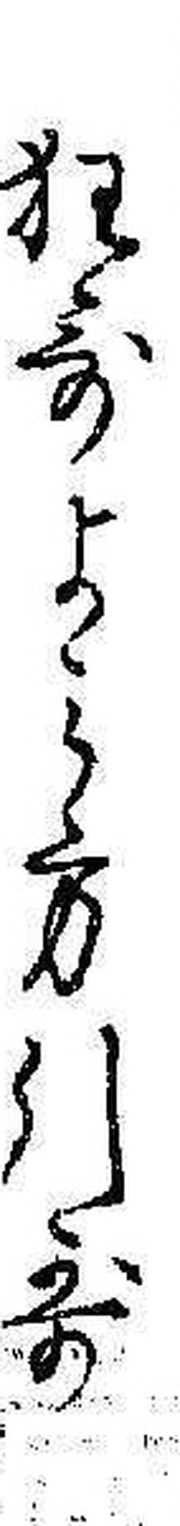狂歌よみ方引歌
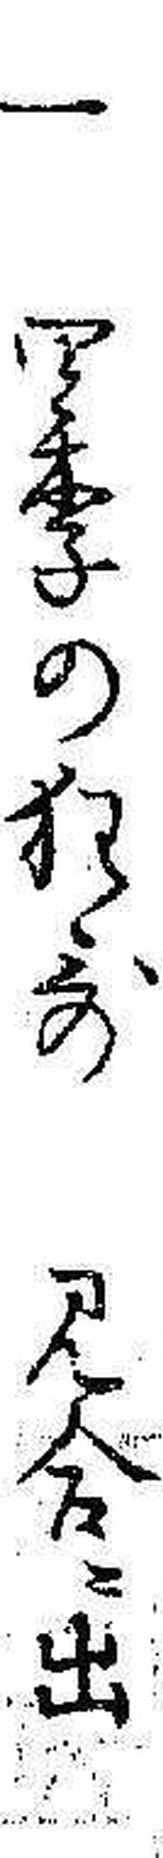一四季の狂歌見合に出
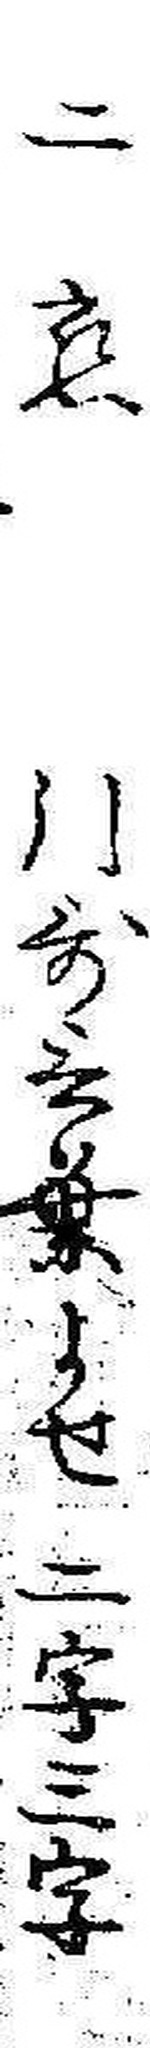二恋引歌言葉よせ二字三字
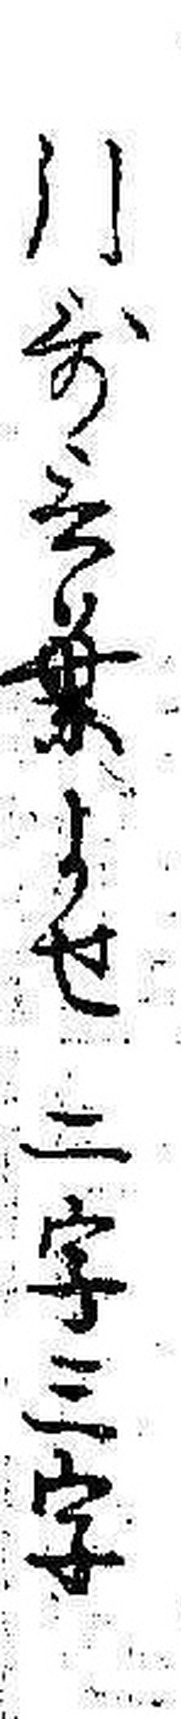二恋引歌言葉よせ二字三字
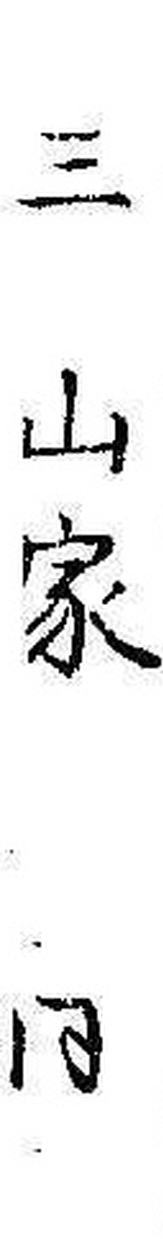三山家同
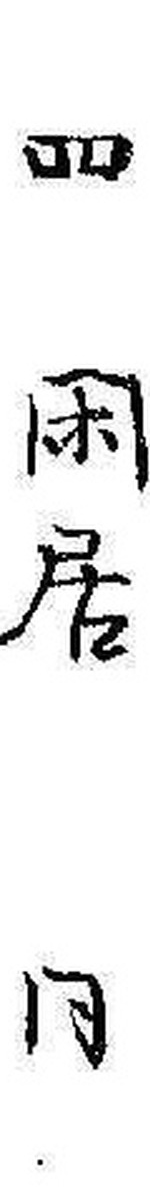四閑居同
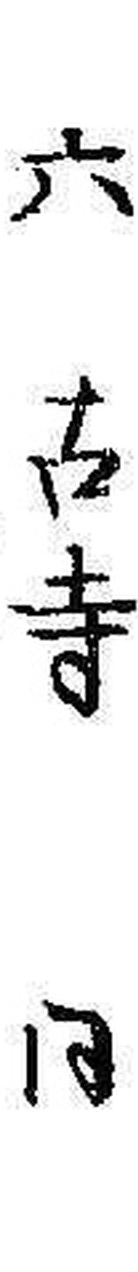六古寺同
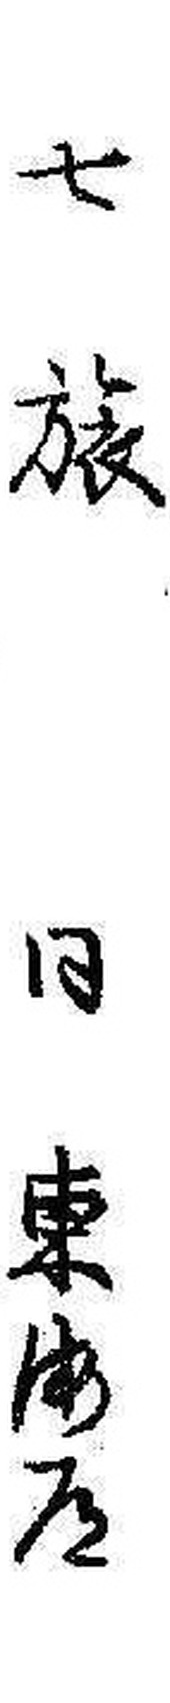七旅同東海道
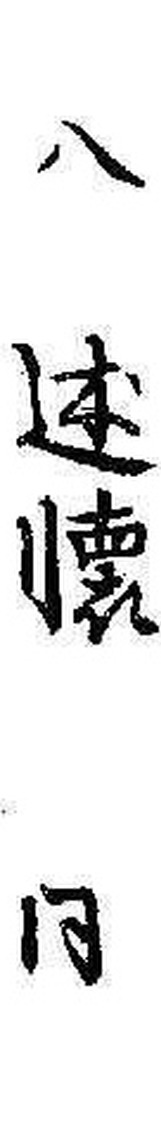八述懐同

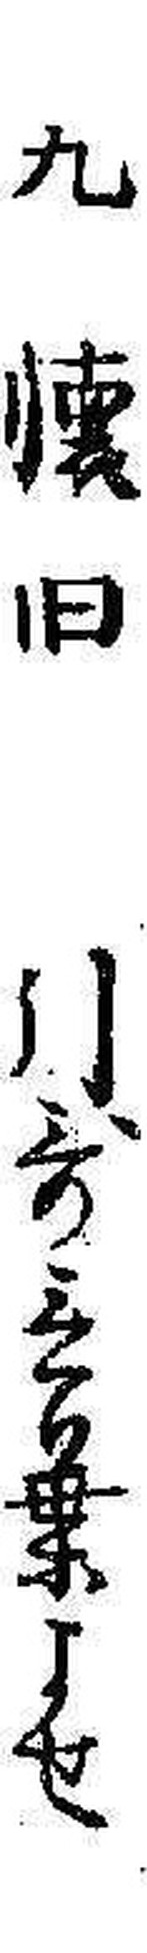九懐旧引歌言葉よせ
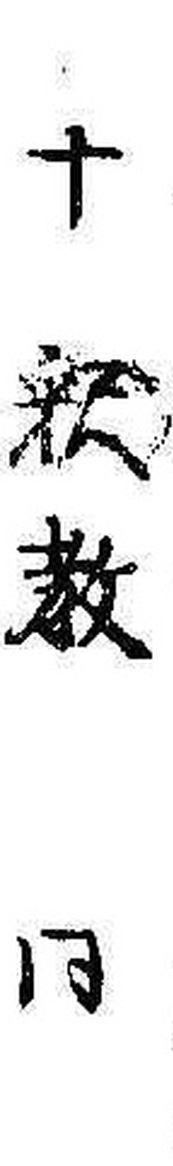十釈教同
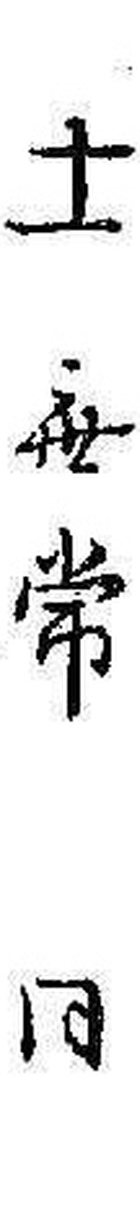十一無常同
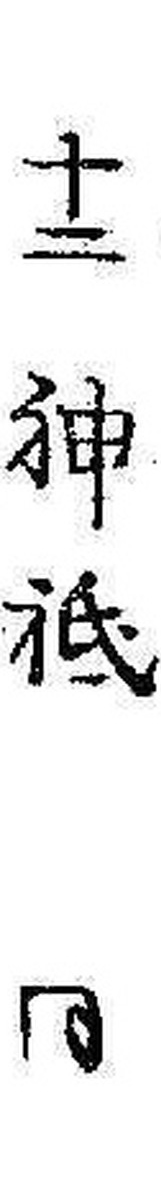十二神祇同
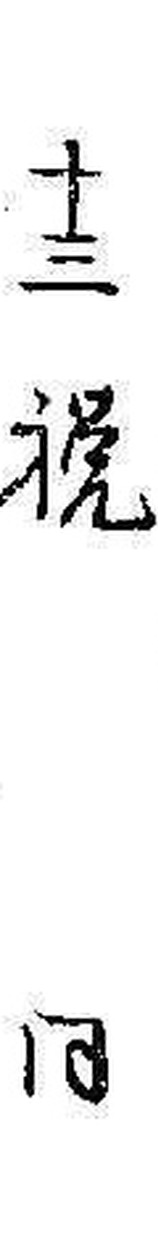十三祝同
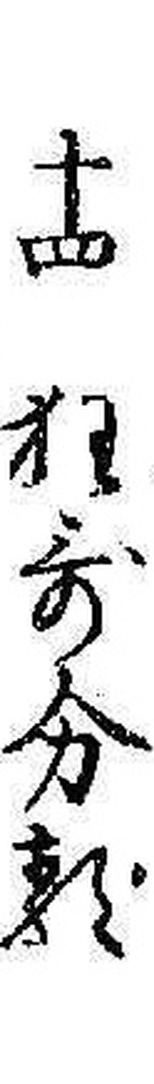十四狂歌分類
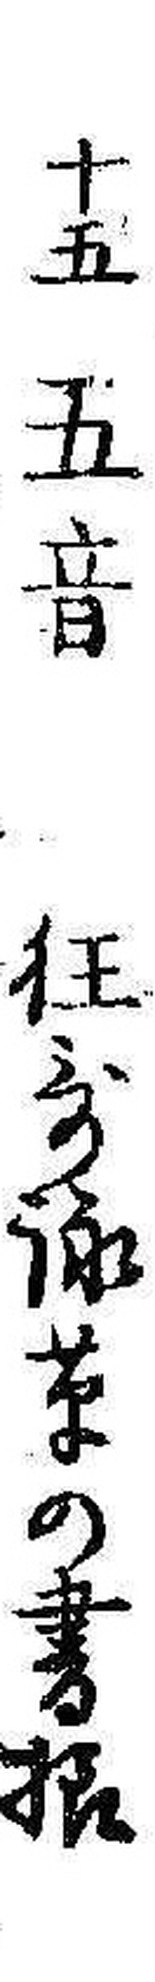十五五音狂歌詠草の書様
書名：狂哥はまのきさご
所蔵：国文学研究資料館
